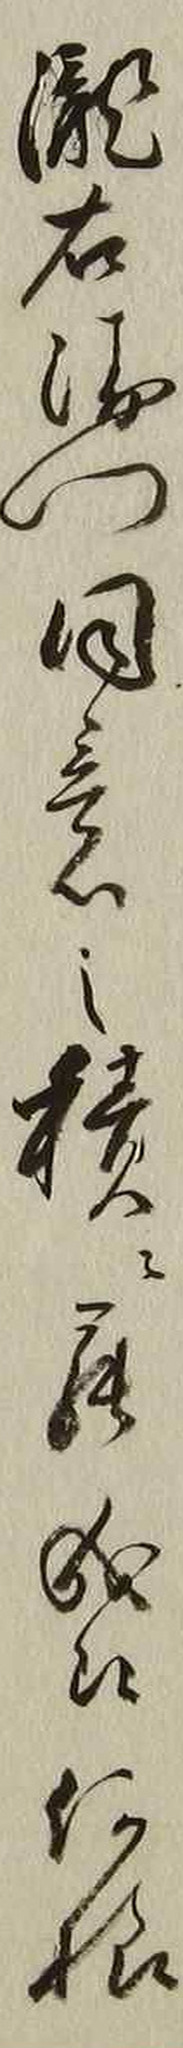滝右衛門同意之積ニ罷成候何様
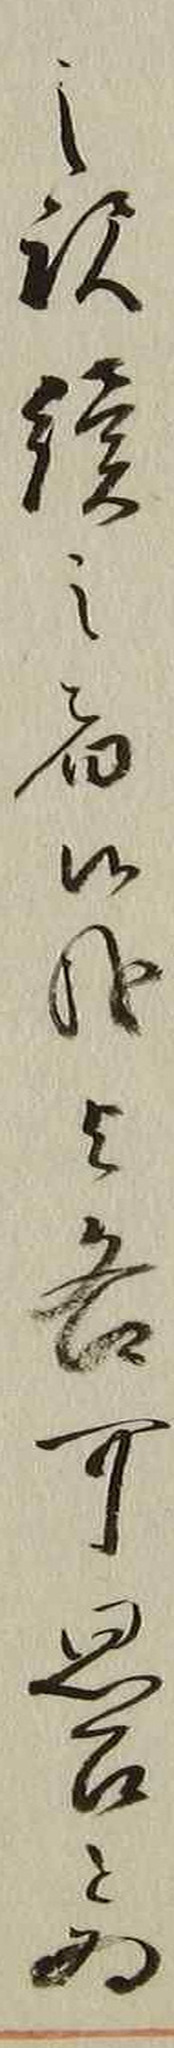之訳続之者候哉与各可思召と為
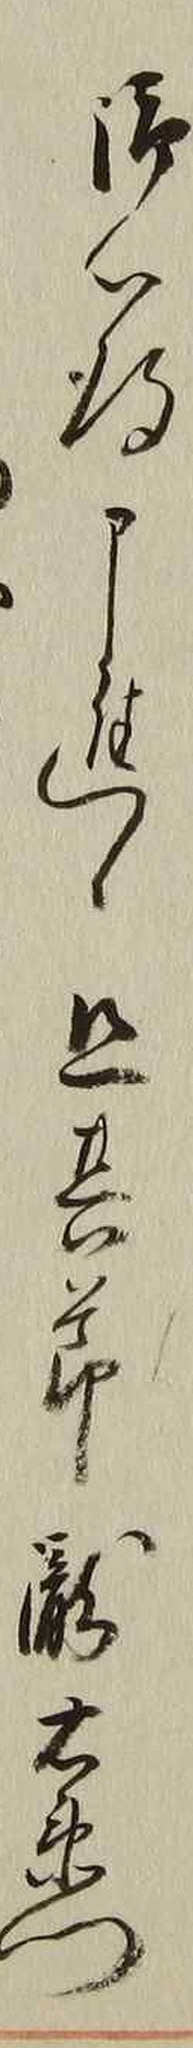御心得申進候且其節滝右衛門
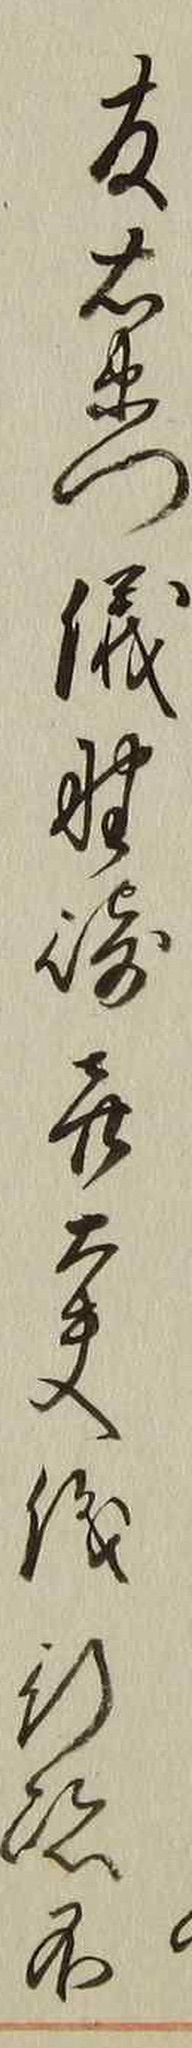友右衛門儀野崎喜大夫儀行跡不
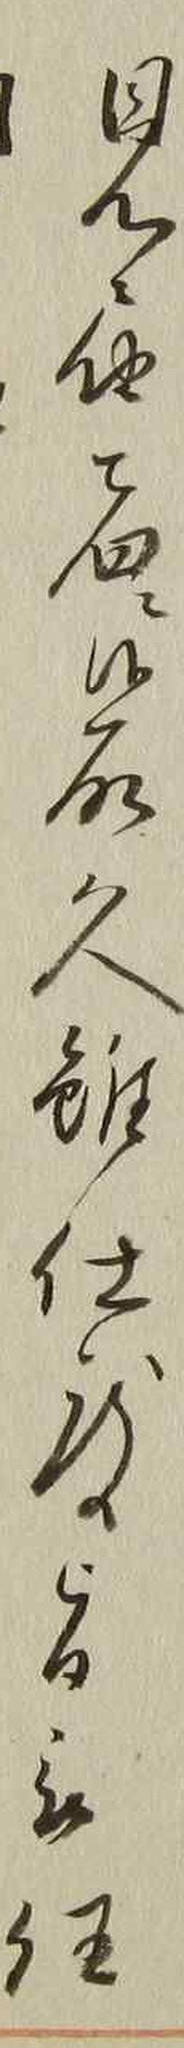見届者ニ候故久雖仕度旨被任
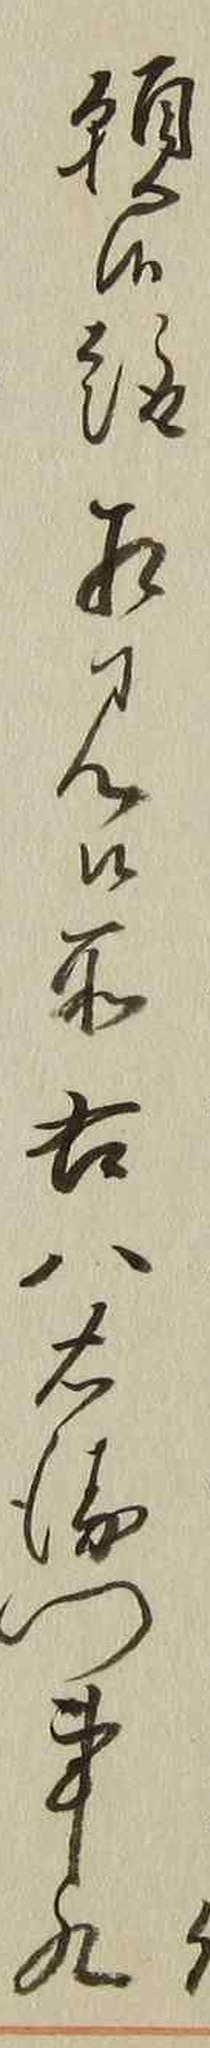願候趣相見候所右八右衛門事九
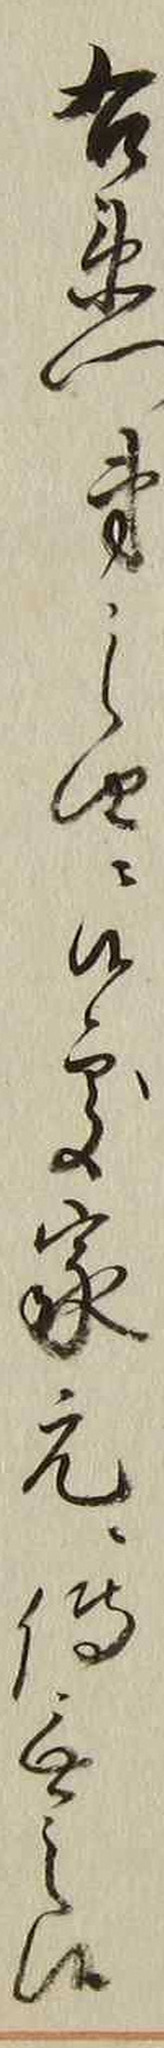右衛門弟之由ニ候処家元ニ伝無之候
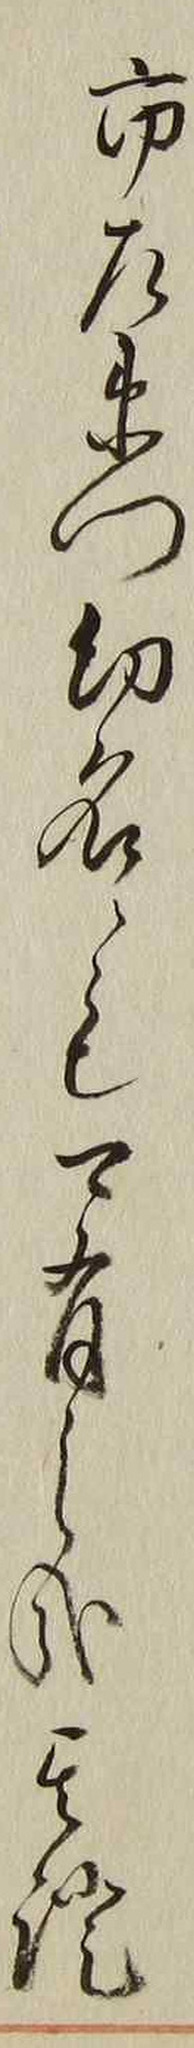市左衛門幼名ニも可有之哉其証

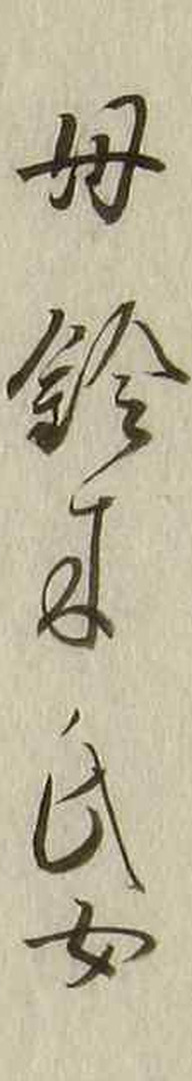母鈴木氏女
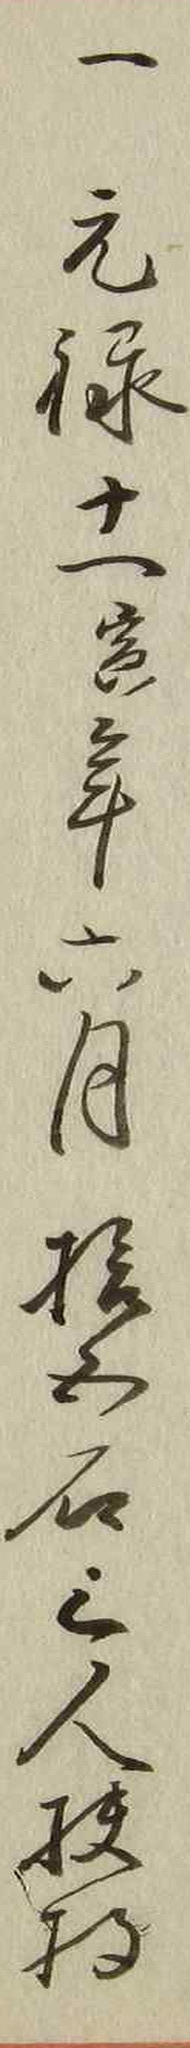一元禄十一寅年六月拾五石三人扶持
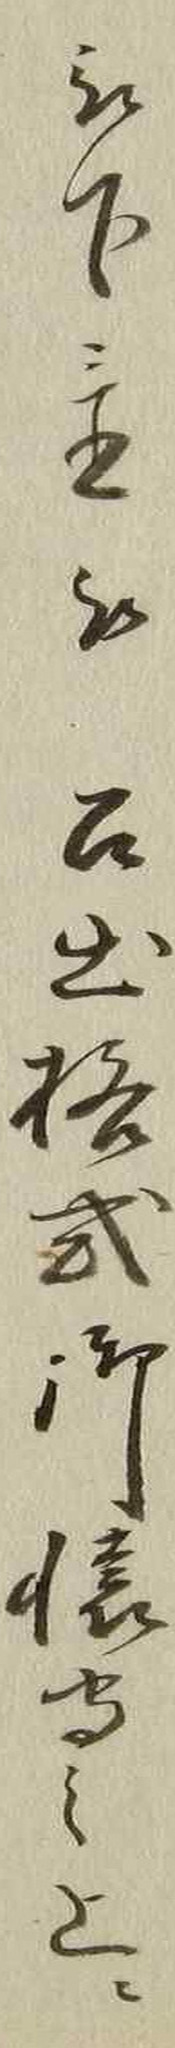被下置被召出格式御懐守之上ニ
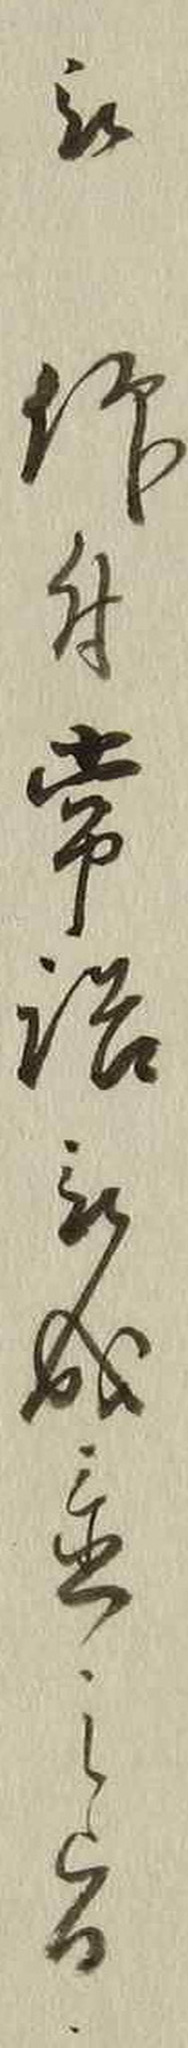被仰付常詰被成置之旨
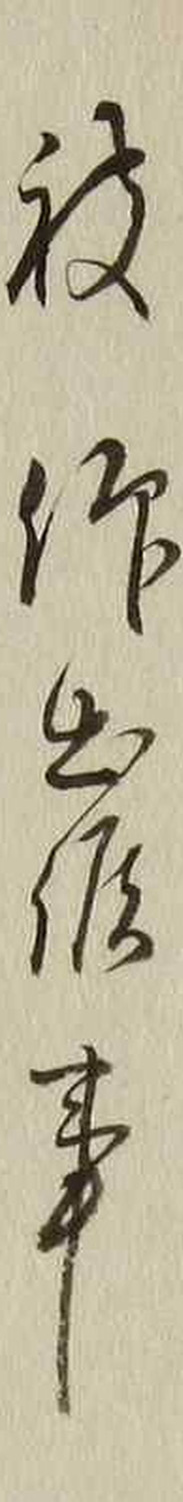被仰出候事
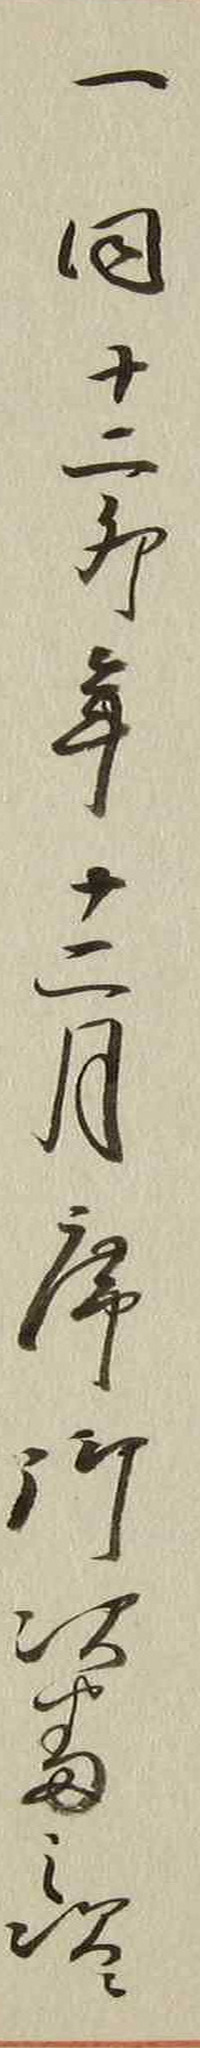一同十二卯年十二月席御次番之次ニ
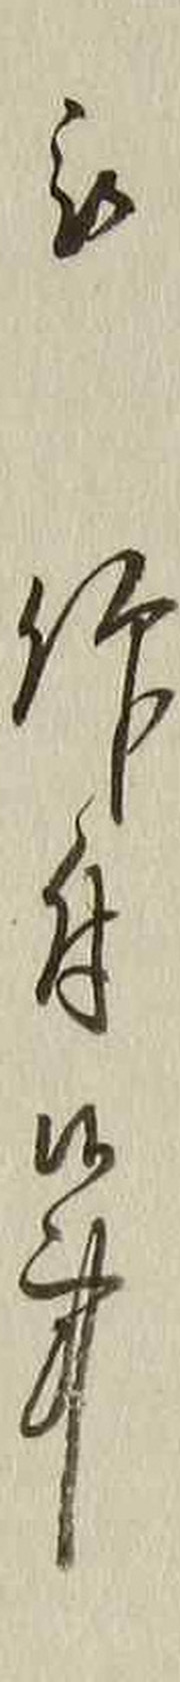被仰付候事
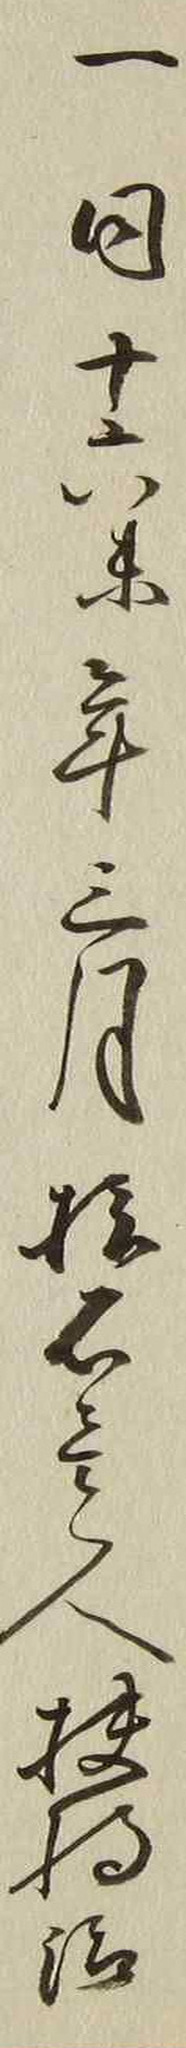一同十六未年三月拾右壱人扶持御
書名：諸士系譜　巻之122　よ之部5
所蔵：会津若松市立会津図書館
